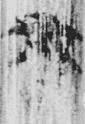天
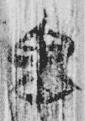畏（威）
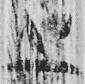之
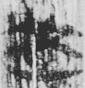武
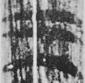王
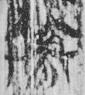素
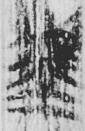○（甲）
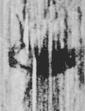㠯（以）
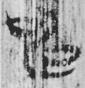申（陳）
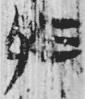於
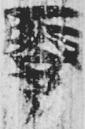○（殷）
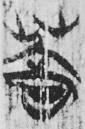蒿（郊）
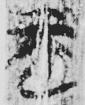而
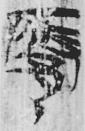○（殷）
